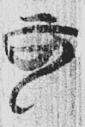可
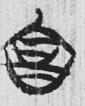合
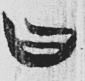曰
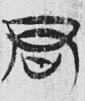君
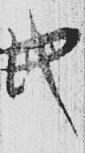母
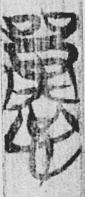○（憚）
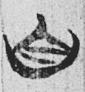自
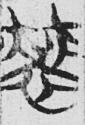○（勞）
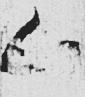㠯
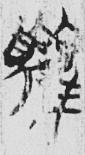觀
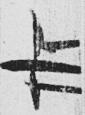上下
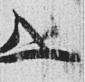之
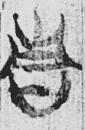青（情）
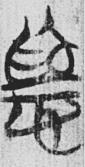○（僞）
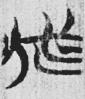○（匹）
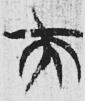夫
